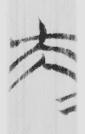夫=
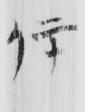住
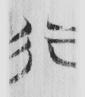行
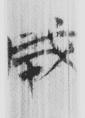成
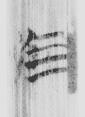於
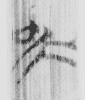吳
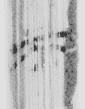帀
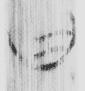曰
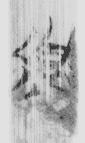寡
